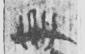卌
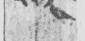一
